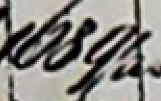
1689/a
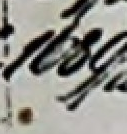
1689/a
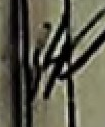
84
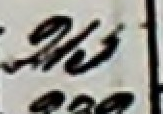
213
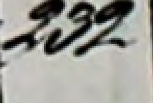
232
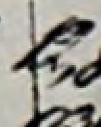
12,8
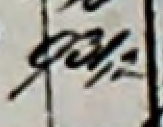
931,2
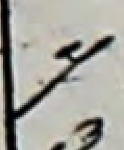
7
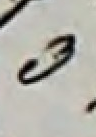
3
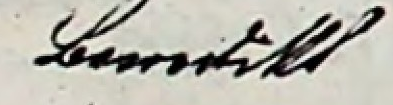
Benedikt
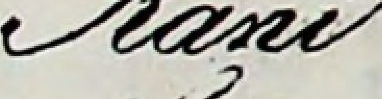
Kani
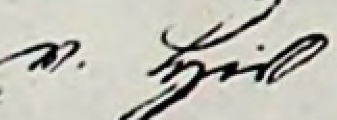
v. His
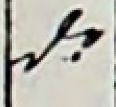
Do
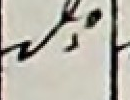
Do
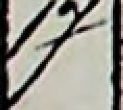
17
